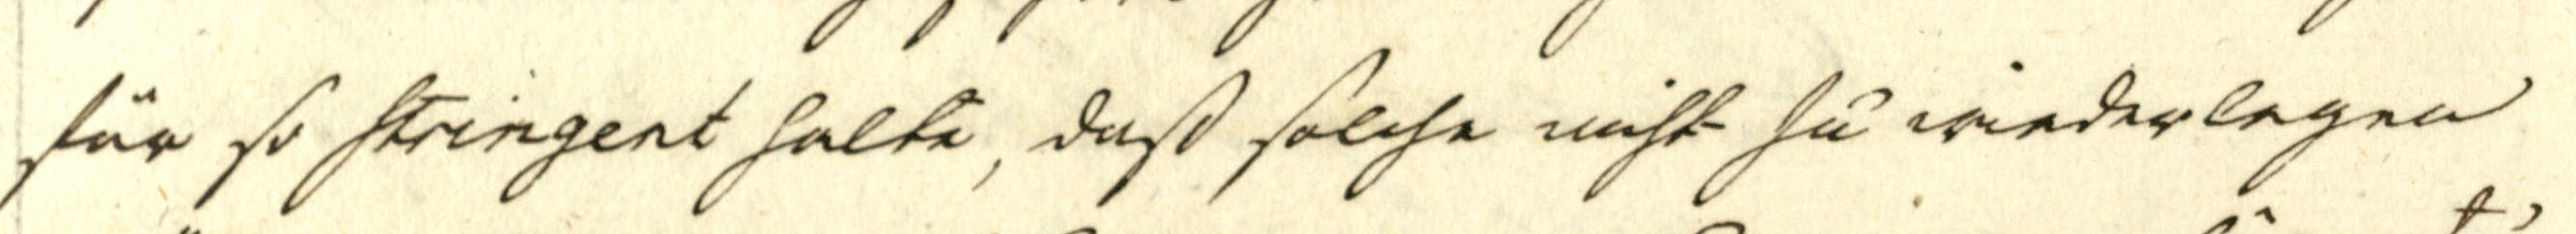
für so stringent halte, daß solche nicht zu wiederlegen
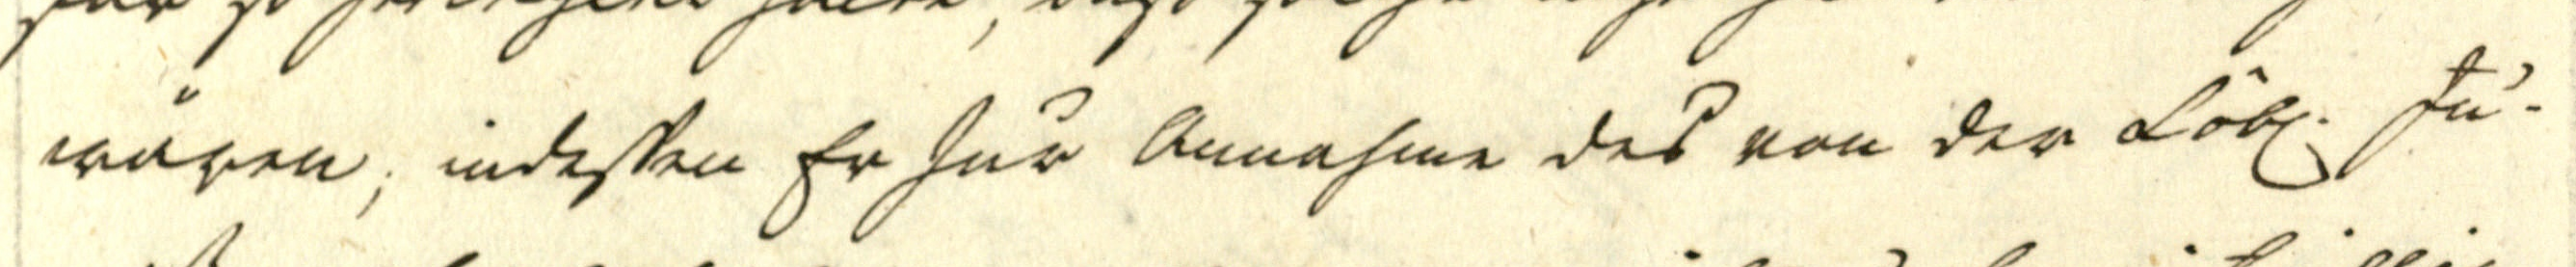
wären, indessen Er zur Annahme des von der Löbl. Ju¬
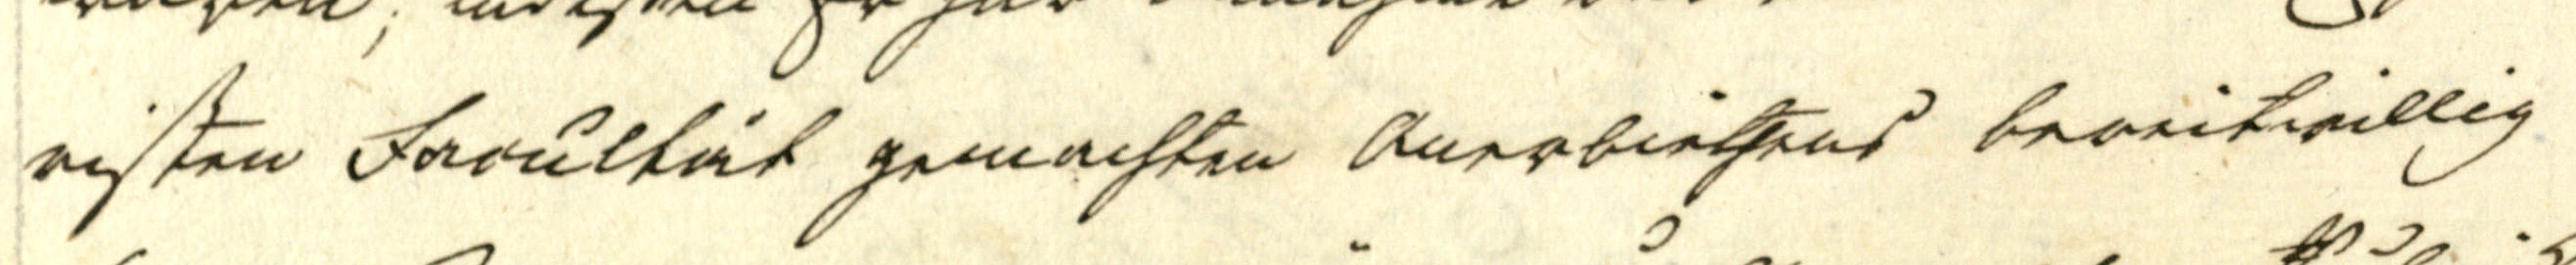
risten Facultät gemachten Anerbiethens bereitwillig
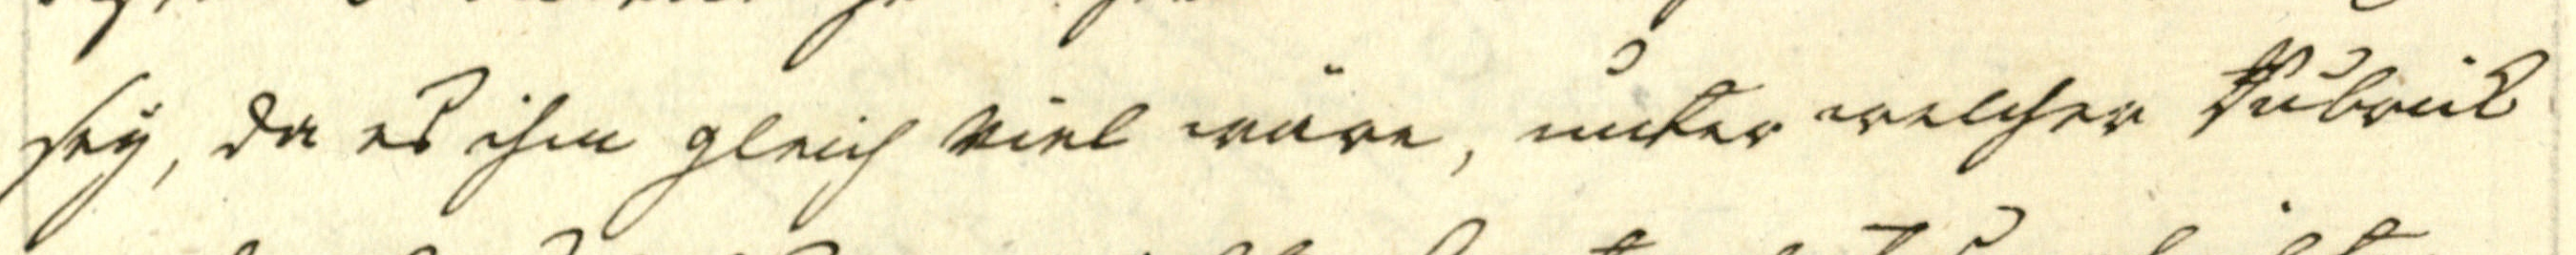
seÿ, da es ihm gleich viel wäre, unter welcher Rubrick
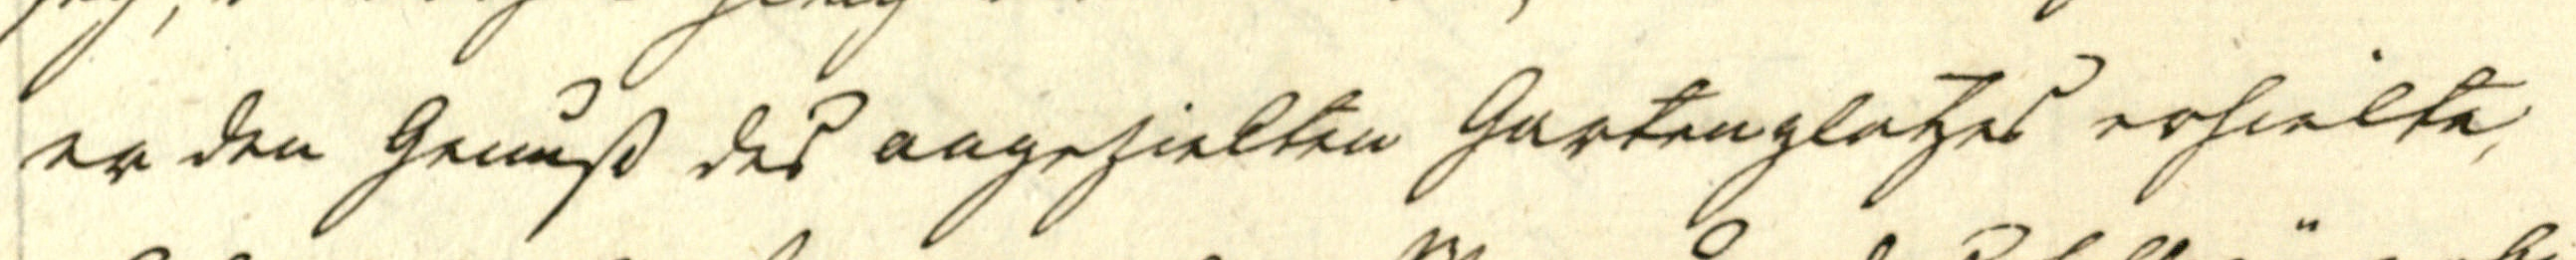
er den Genuß des angezielten Gartenplatzes erhielte,
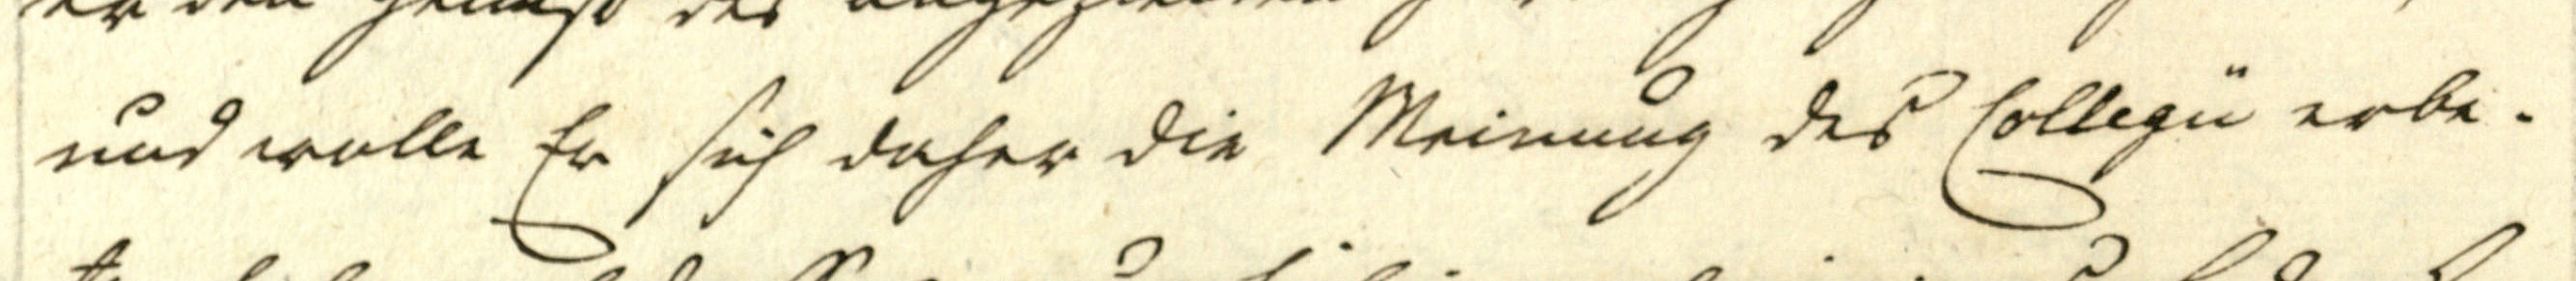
und wolle Er sich daher die Meinung des Collegii erbe¬
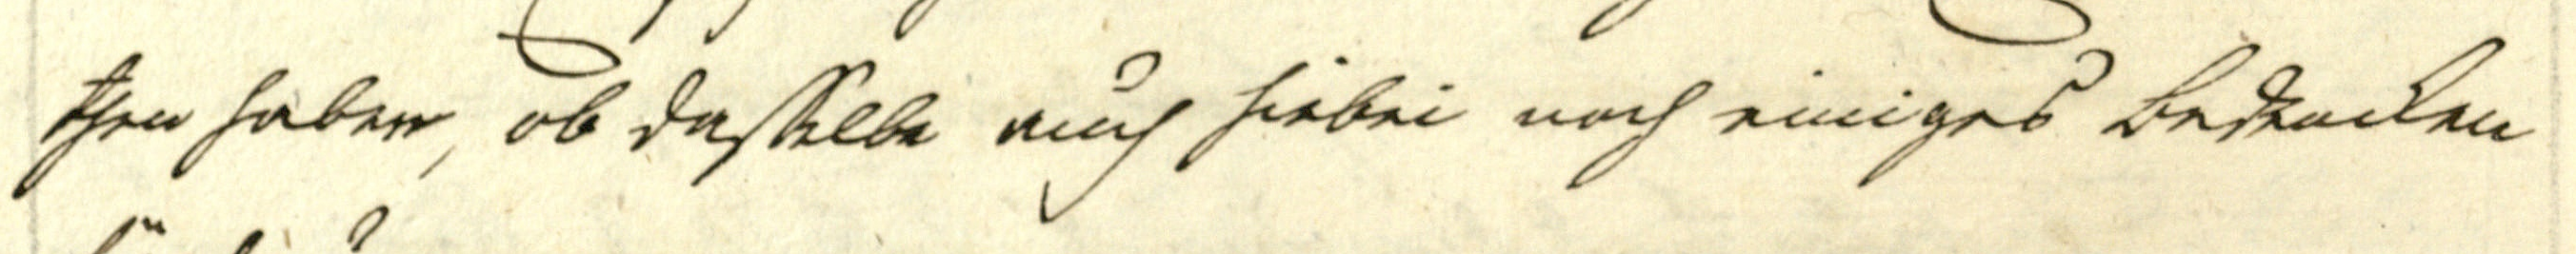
then haben, ob dasselbe auch hiebei noch einiges Bedencken
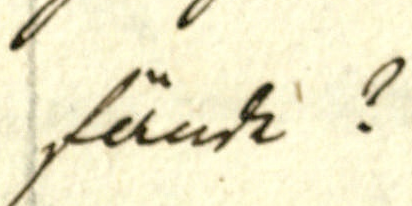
fände?
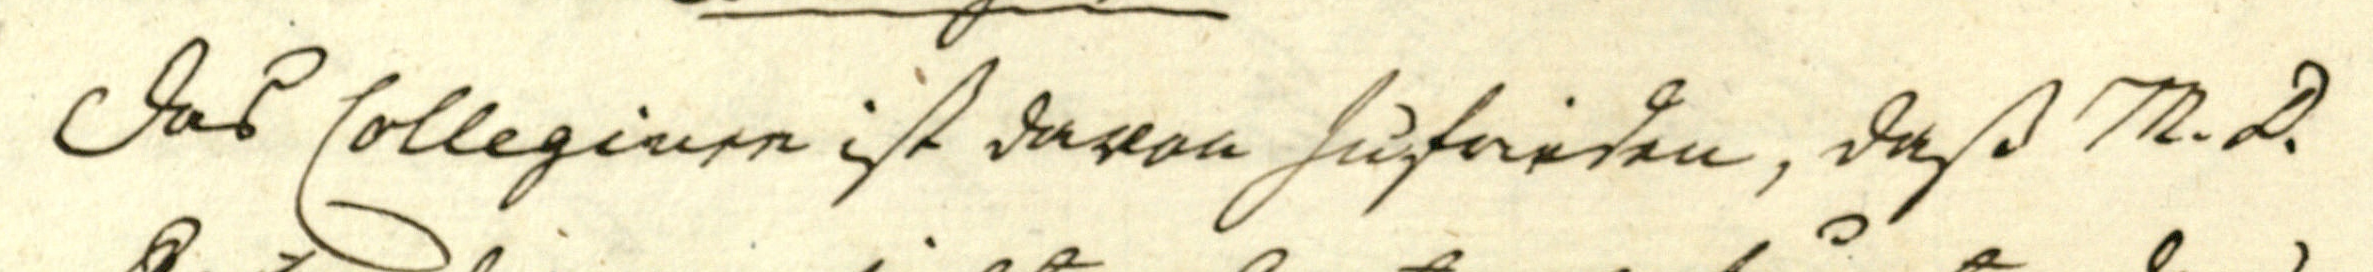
Das Collegium ist davon zufrieden, daß M. D.
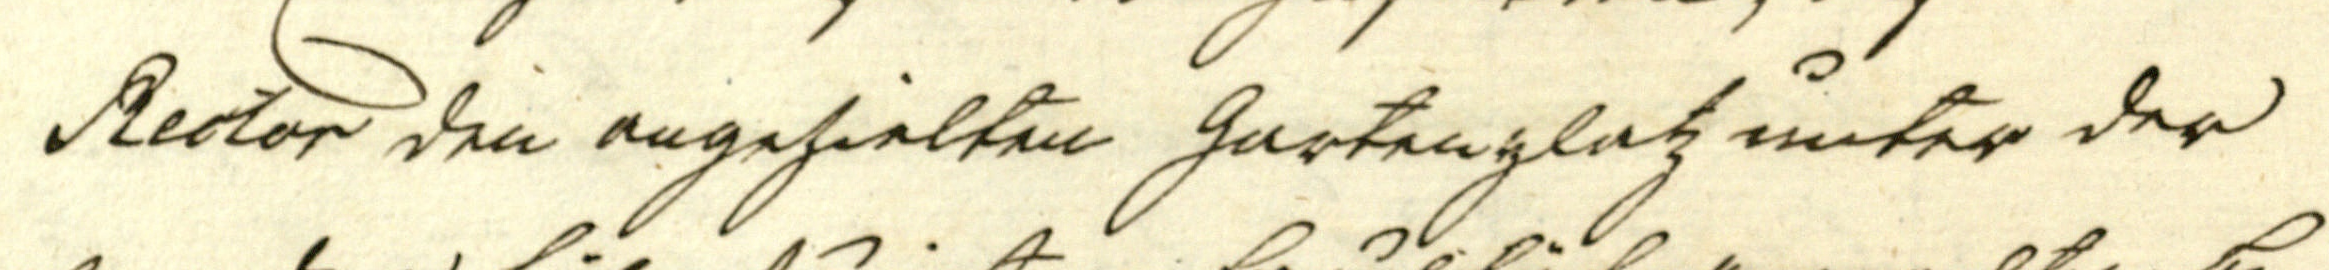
Rector den angezielten Gartenplatz unter der
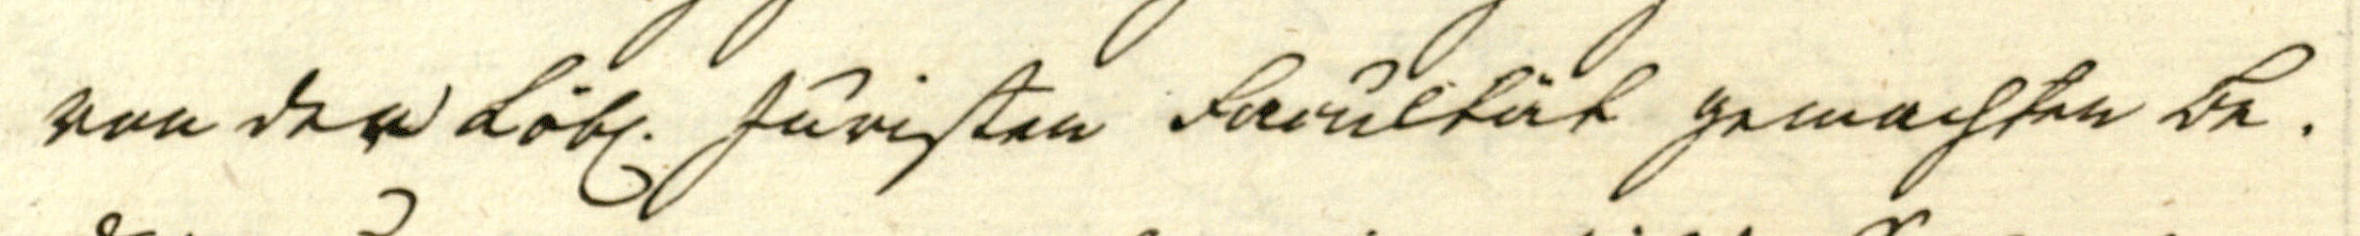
von der Löbl. Juristen Facultät gemachten Be¬
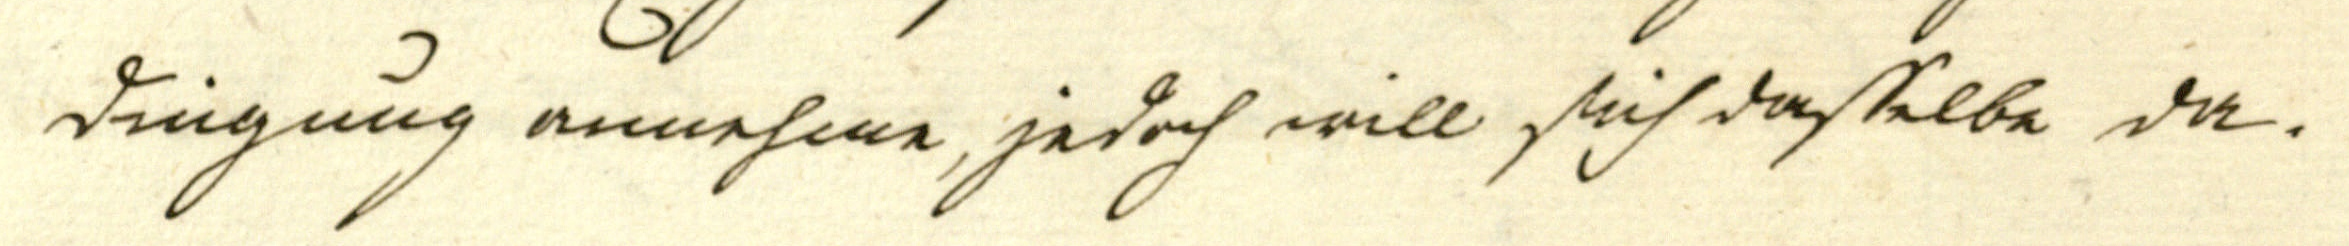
dingung annehmen, jedoch wie sich dasselbe da¬
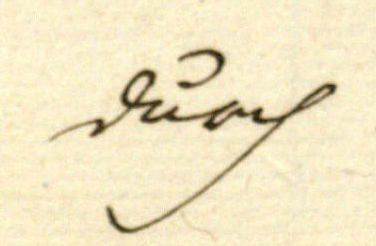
durch
